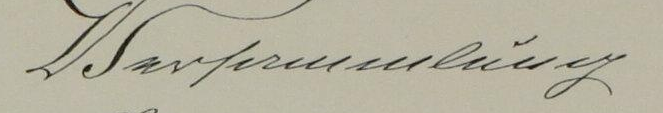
Versammlung
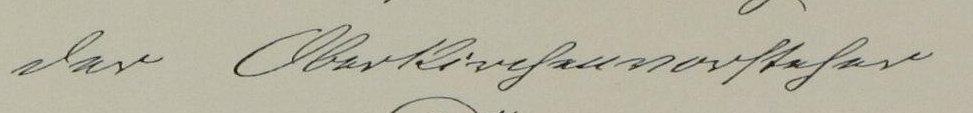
der Oberkirchenvorsteher
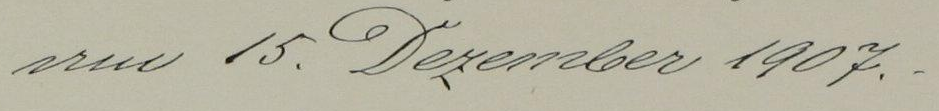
am 15. Dezember 1907.
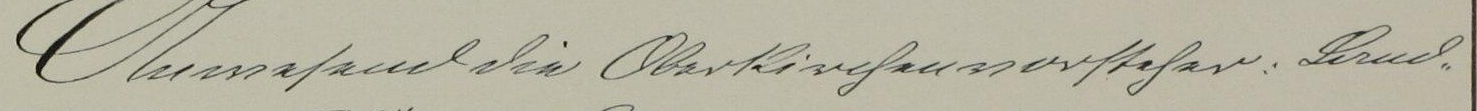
Anwesend die Oberkirchenvorsteher: Land-
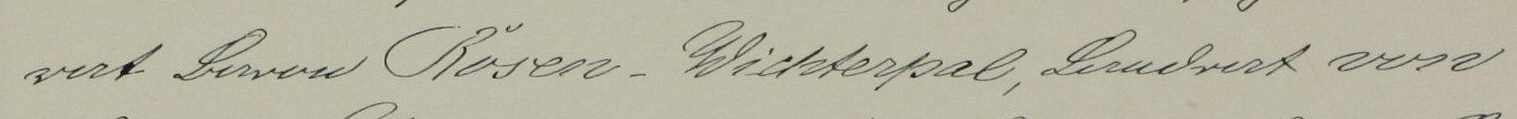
rat Baron Rosen-Wichterpal, Landrat von
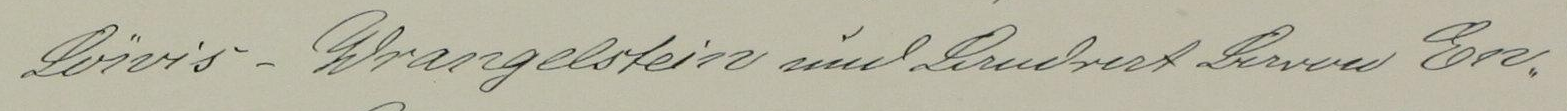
Löwis-Wrangelstein und Landrat Baron En-
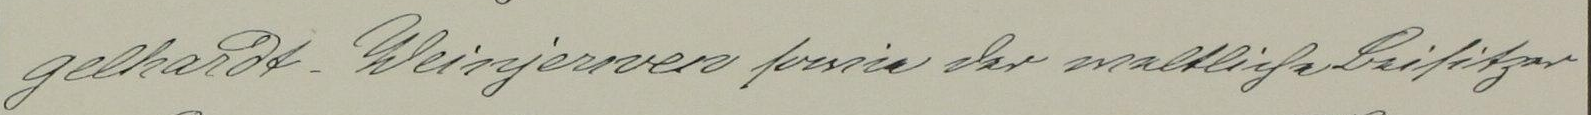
gelhardt-Weinjerwen, sowie der weltliche Beisitzer
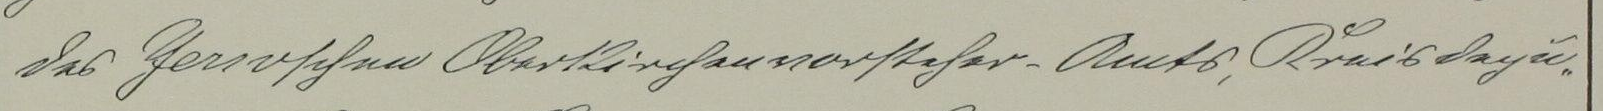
des Jerwschen Oberkirchenvorsteher-Amts, Kreisdepu-
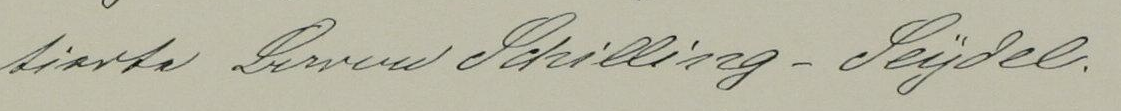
tierte Baron Schilling-Seydel.
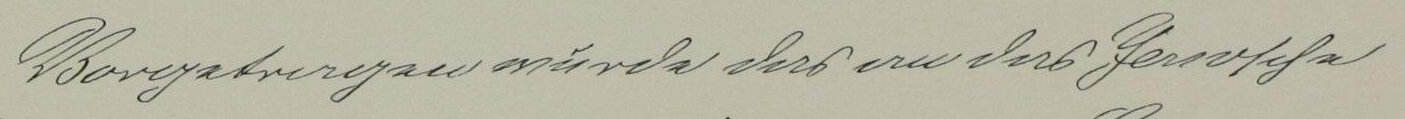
Vorgetragen wurde das an das Jerwsche
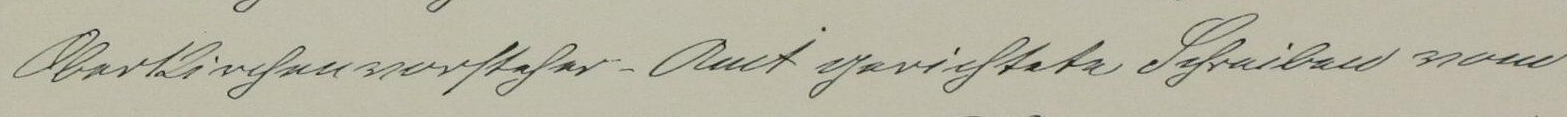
Oberkirchenvorsteher-Amt gerichtete Schreiben vom
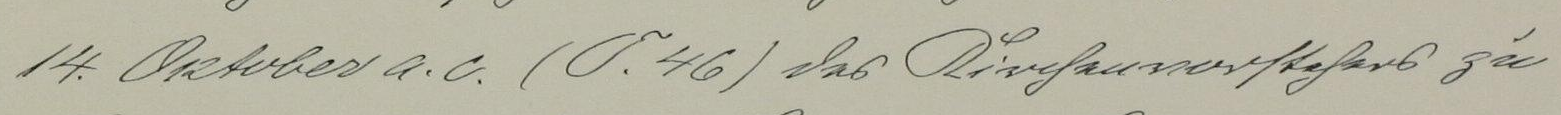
14. Oktober a.c. (T.46) des Kirchenvorstehers zu
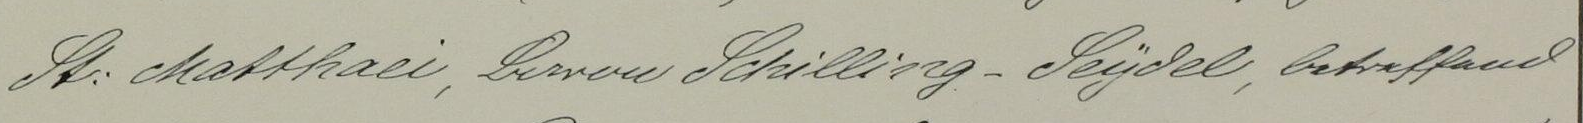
St. Matthaei, Baron Schilling-Seydel, betreffend
